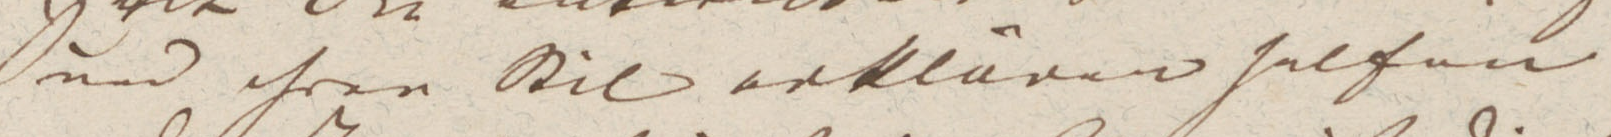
und ihren Stil erklären helfen.
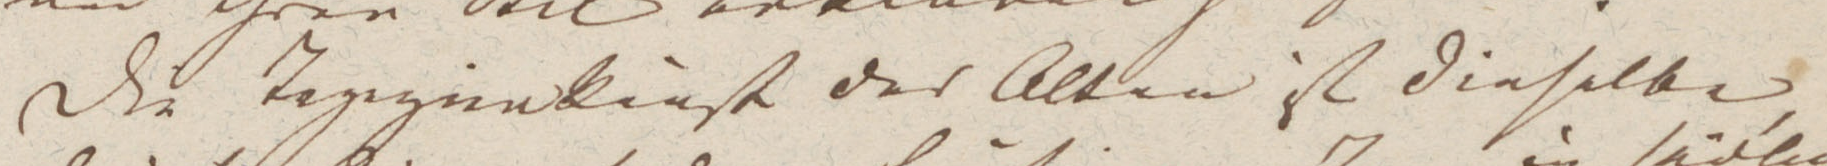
Die Tapezierkunst der Alten ist dieselbe
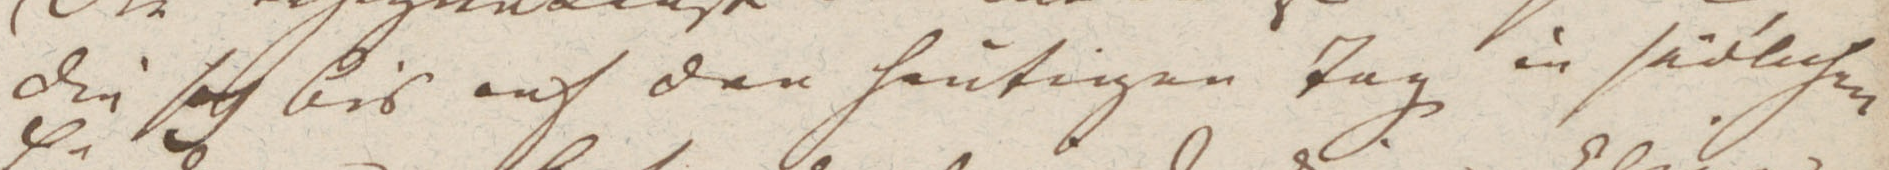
die sich bis auf den heutigen Tag in südlichen
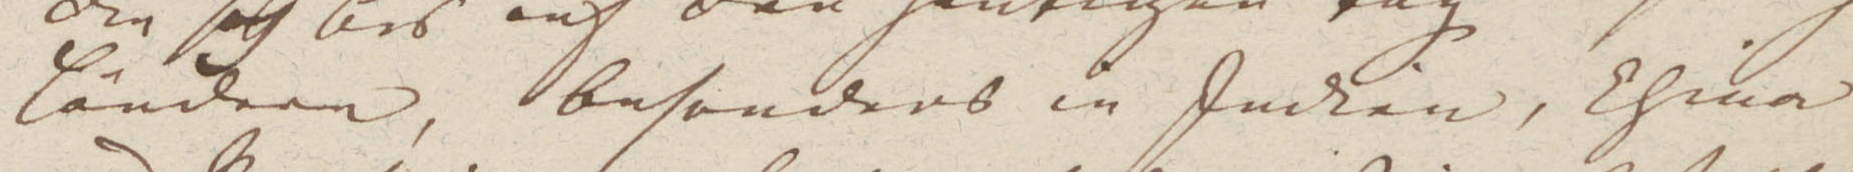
Ländern, besonders in Indien, China
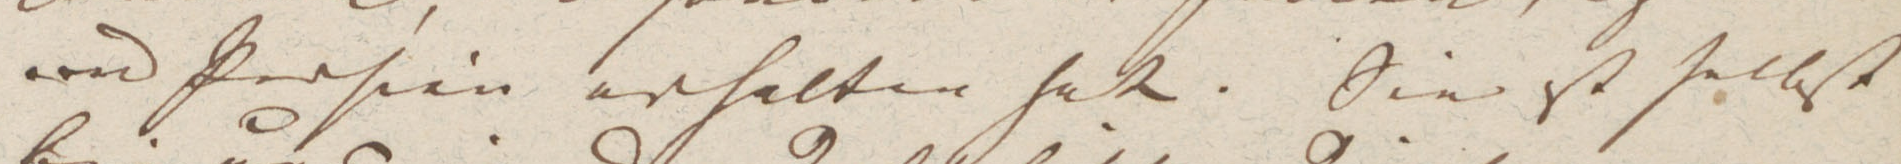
und Persien erhalten hat. Sie ist selbst
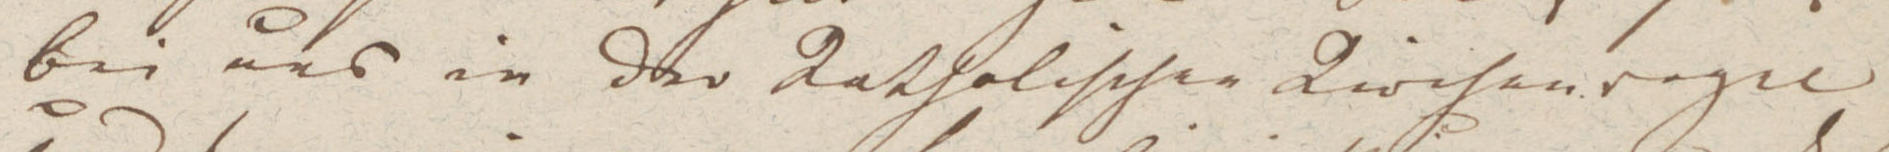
bei uns in der Katholischen Kirchenregel
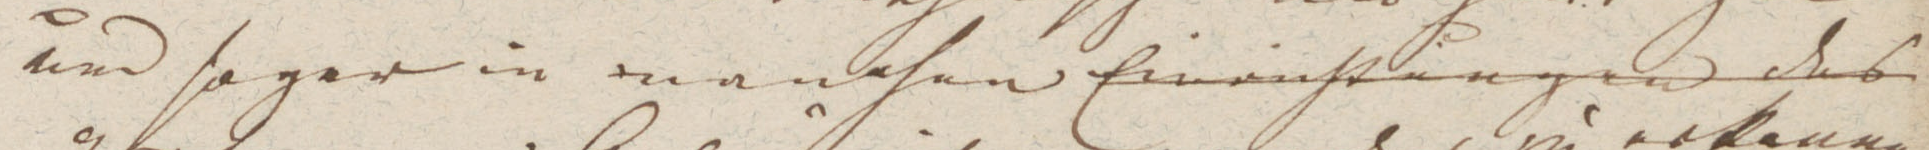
und sogar in manchen Einrichtungen des
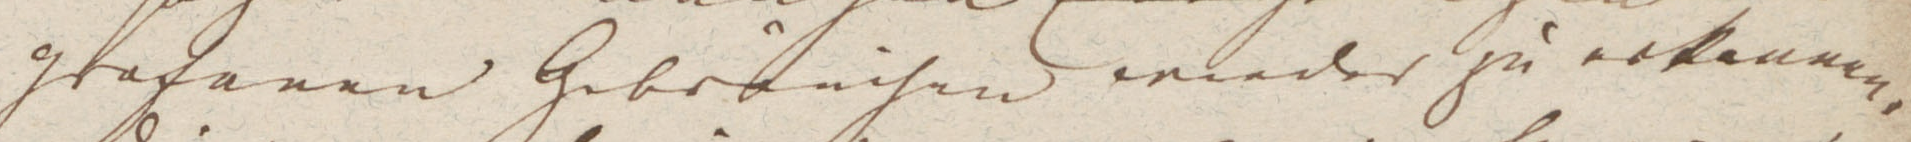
profanen Gebräuchen wieder zu erkennen.
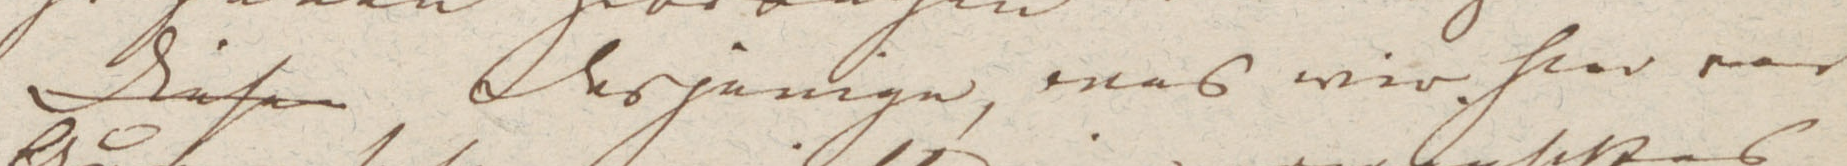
Diesen Dasjenige, was wir hier vor
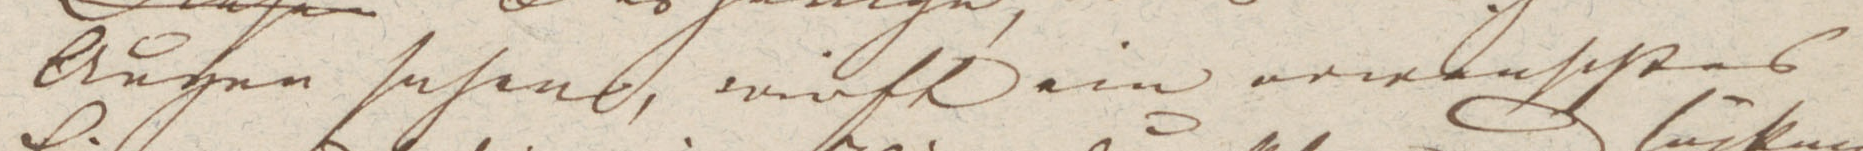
Augen sehen, wirft ein erwünschtes
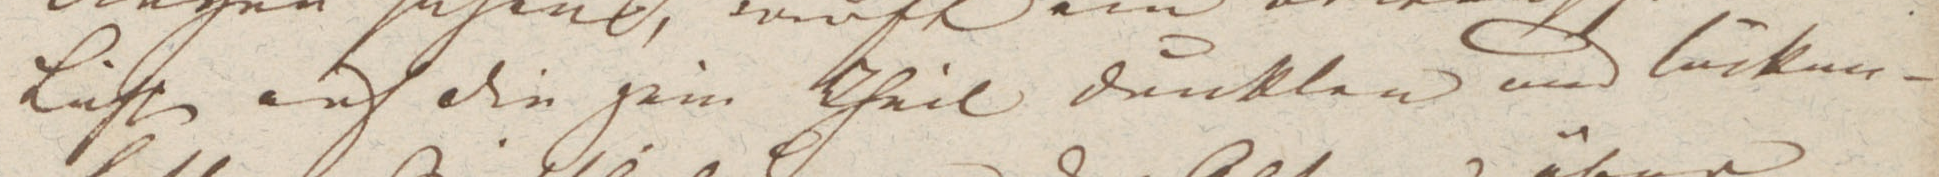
Licht auf die zum Theil dunklen und lücken-
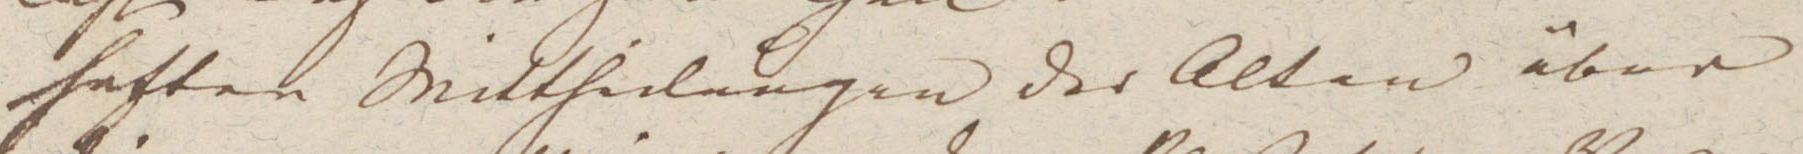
haften Mittheilungen der Alten über
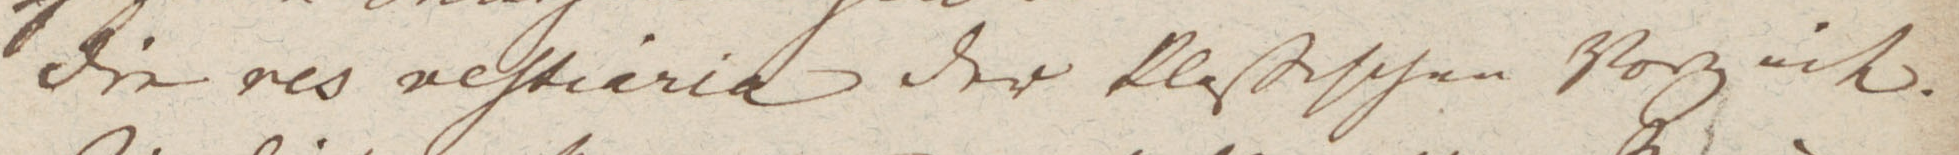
die res vestiaria der klassischen Vorzeit.
